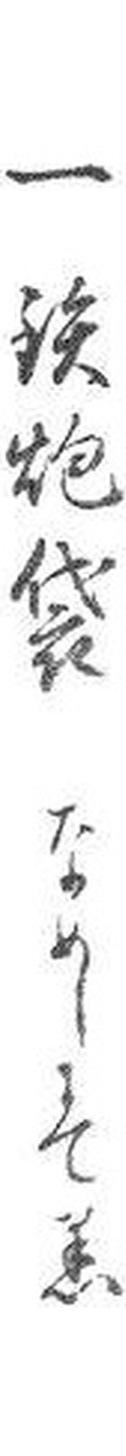一鉄砲袋なめしにて黒
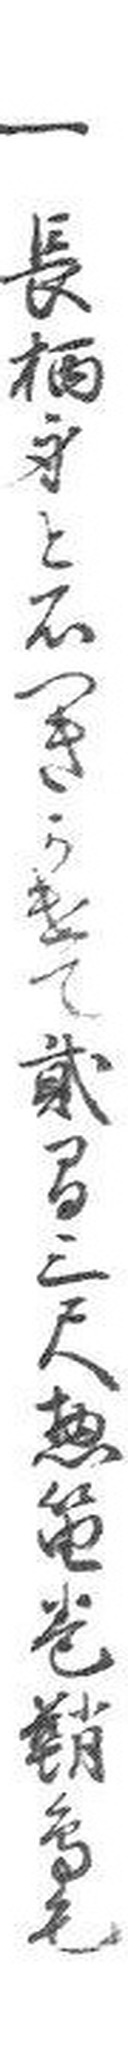一長柄身と石つきかけて弐間三尺惣笛巻鞘鳥毛
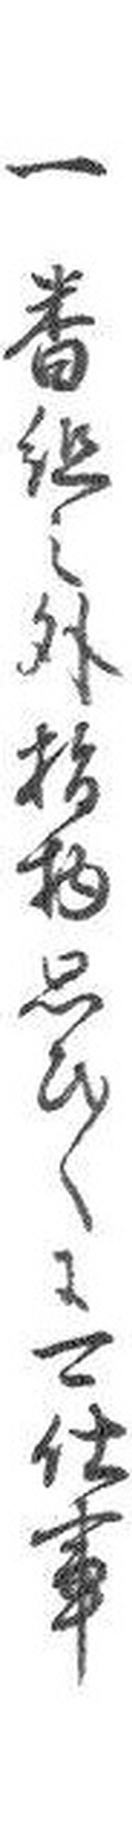一番組之外指物思ひ〳ヽに可仕事
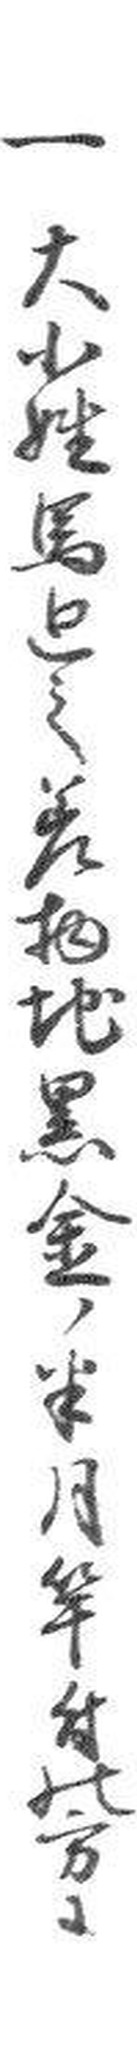一大小姓馬廻之差物地黒金ノ半月竿付の方に
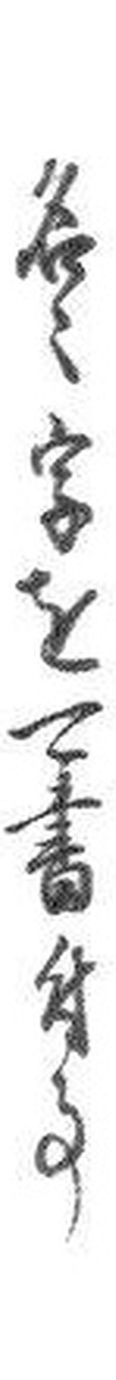各々字を可書付事
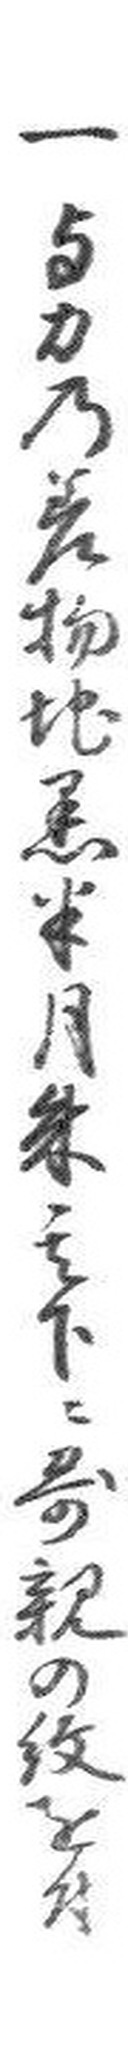一与力の差物地黒半月朱其下ニ寄親の紋を付
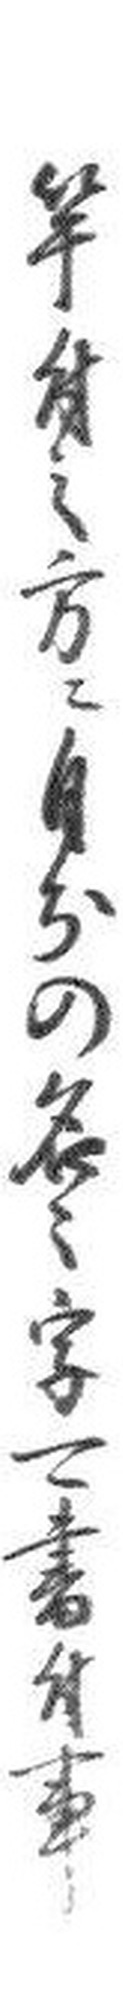竿付之方ニ自分の名々字可書付事
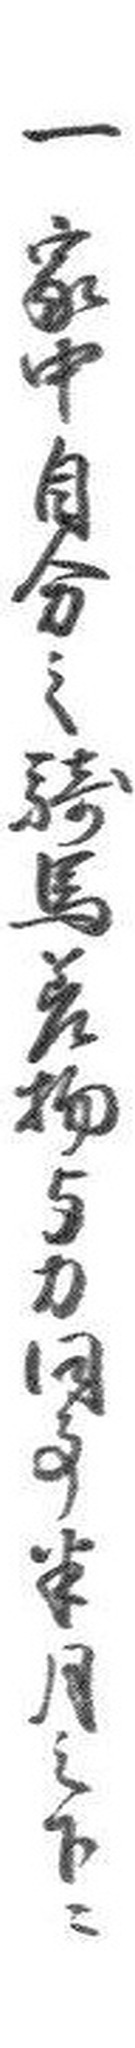一家中自分之騎馬差物与力同事半月之下ニ
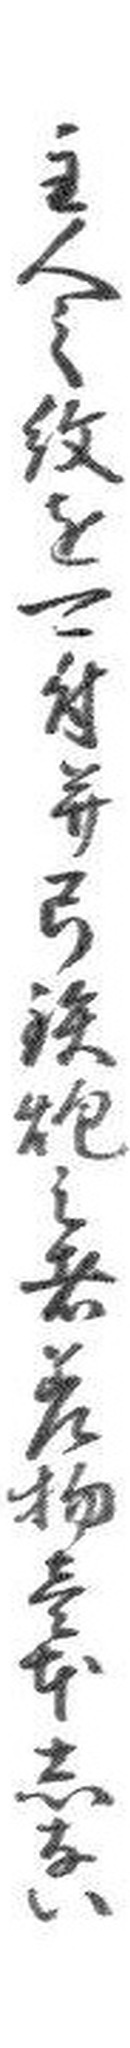主人之紋を可付并弓鉄砲之者差物壱本しない
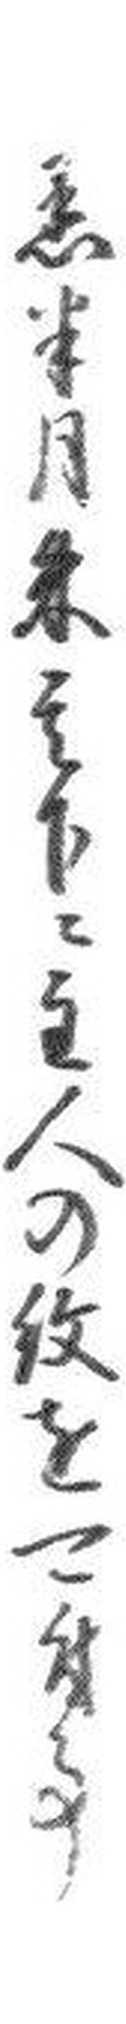黒半月朱其下ニ主人の紋を可付事
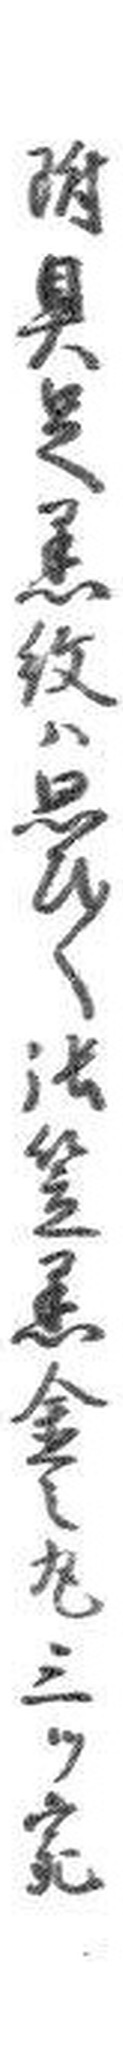附具足黒紋ハ思ひ〳〵張笠黒金之丸三ツ宛
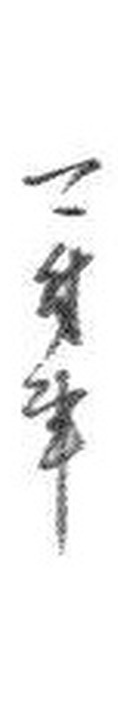可付事
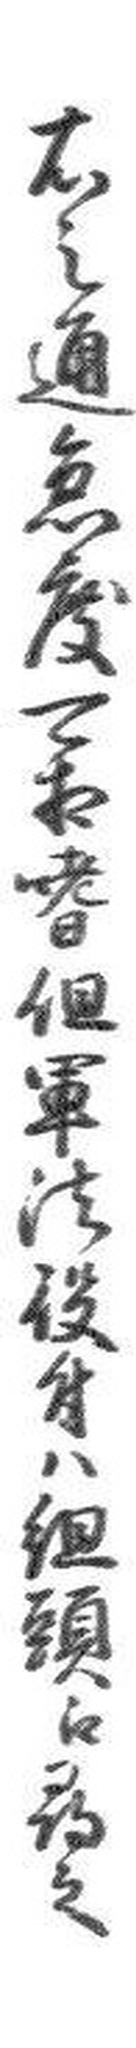右之通急度可相嗜但軍法役付ハ組頭江尋之
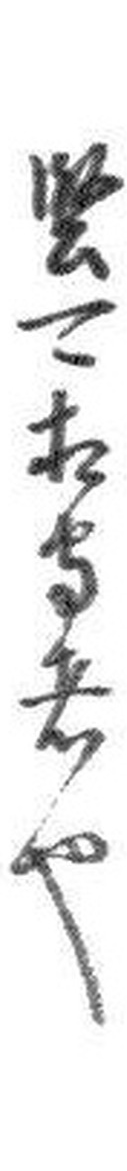堅可相守者也

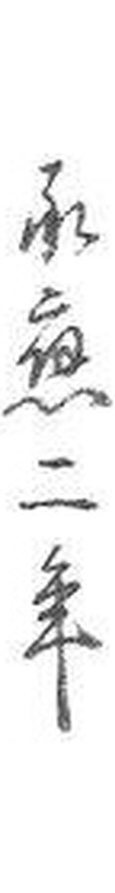承応二年
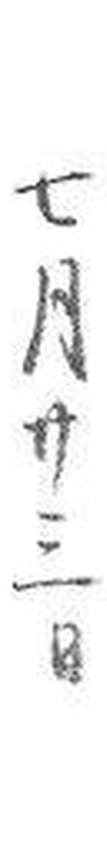七月廿三日
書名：家譜 五 光通公 従寛永十三年到万治二年
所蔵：福井県文書館 Fukui Prefectural Archives
